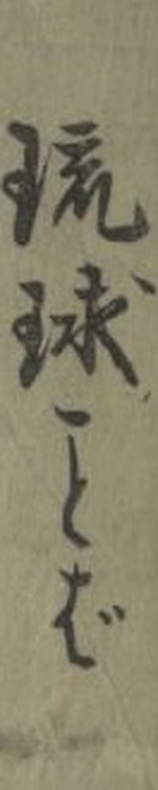琉球ことば
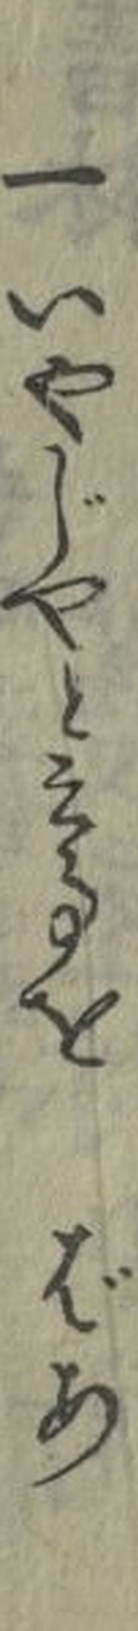一いやじやと云事をばあ
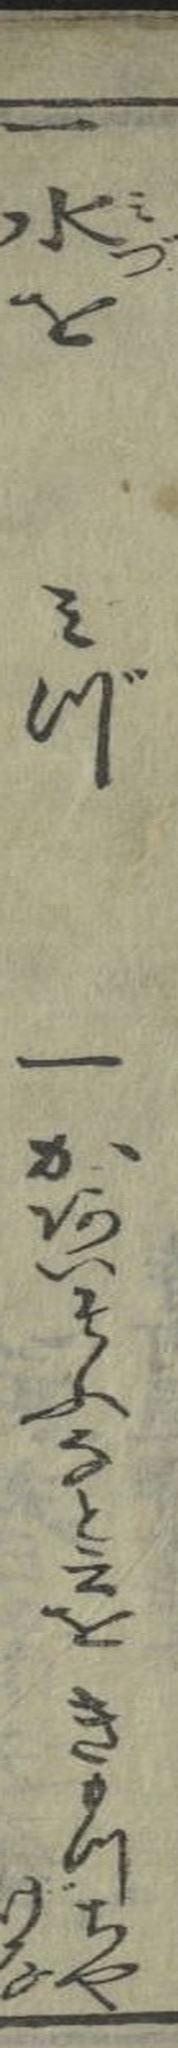一かあいそふなと云をきもつちやげな
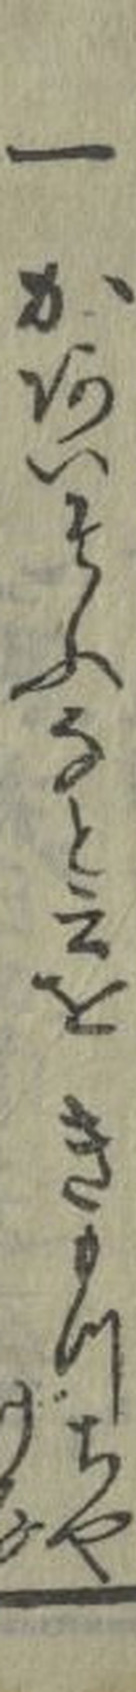一かあいそふなと云をきもつちやげな
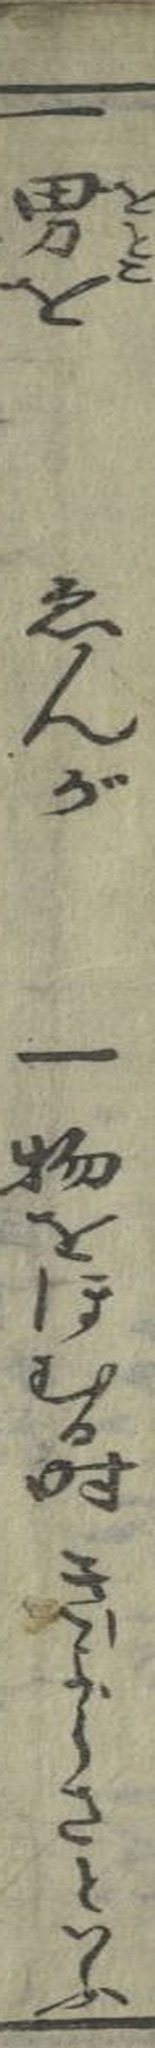一物をほむる時きよらさといふ
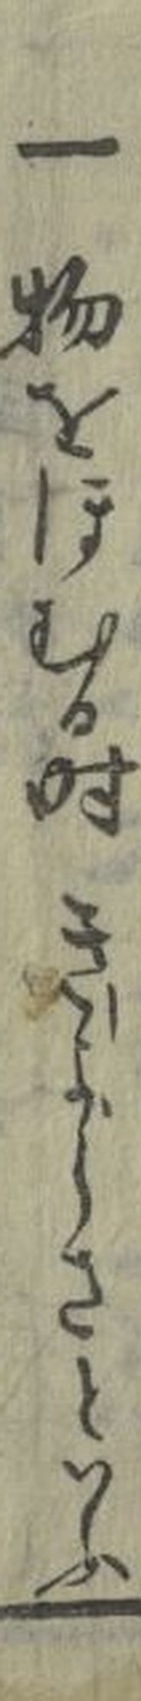一物をほむる時きよらさといふ
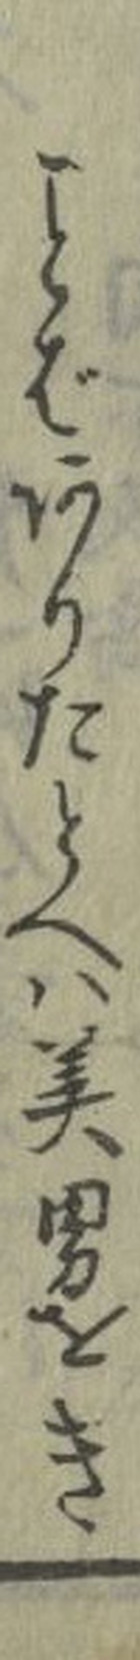ことばありたとへは美男をき
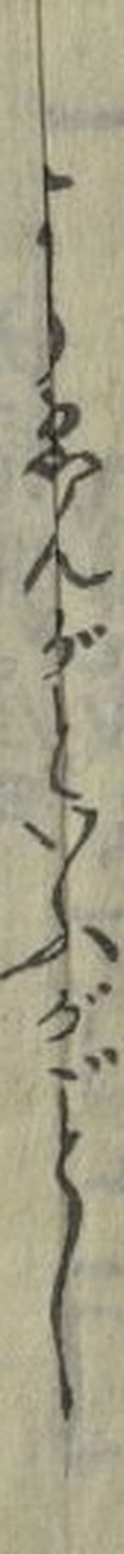よらゑんがといふがごとし
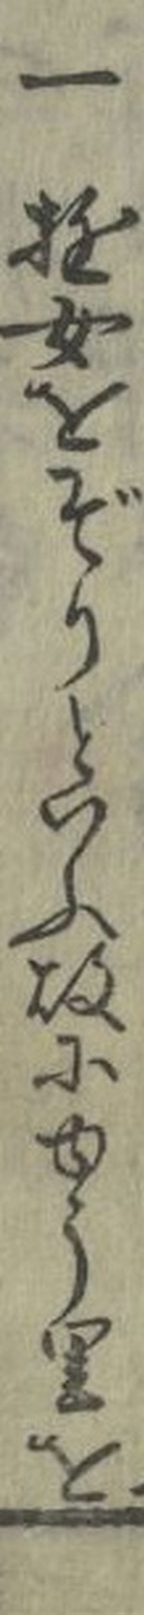一遊女をぞりといふ故にゆう里を
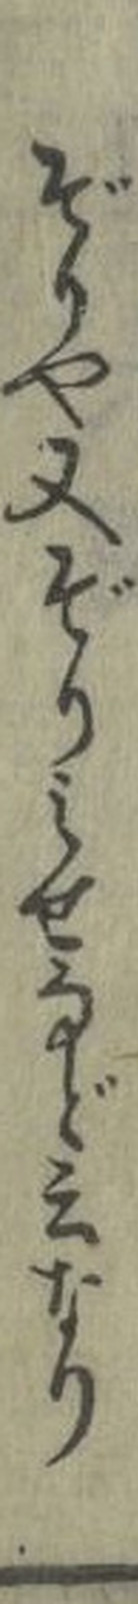ぞりや又ぞりみせなど云なり

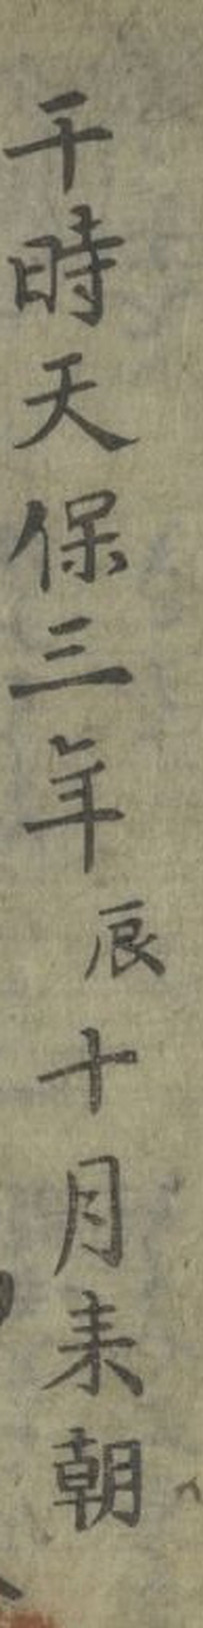干時天保三年辰十月来朝
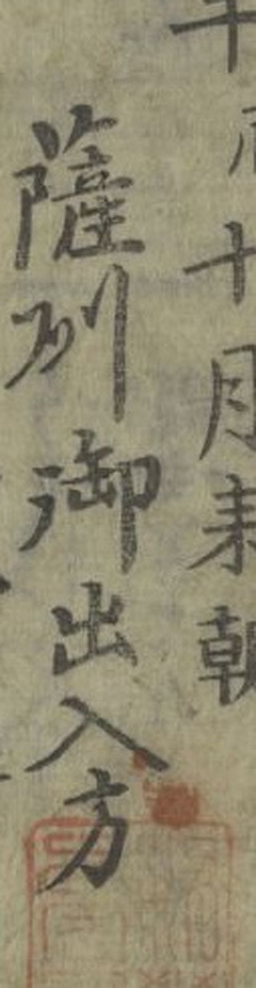薩州御出入方
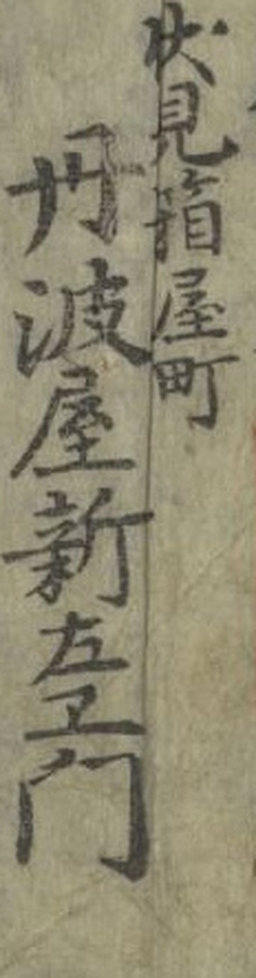丹波屋新左ヱ門
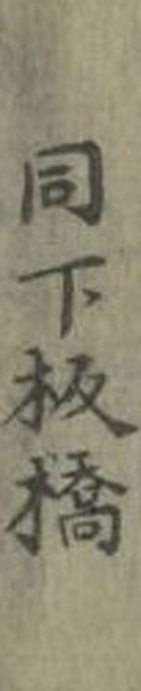同下板橋
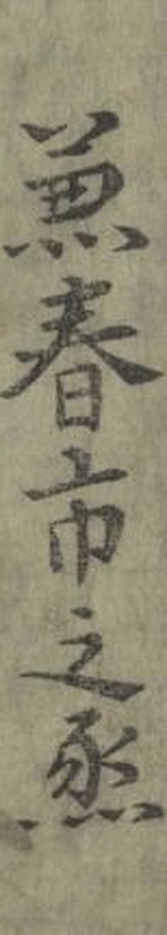兼春市之丞
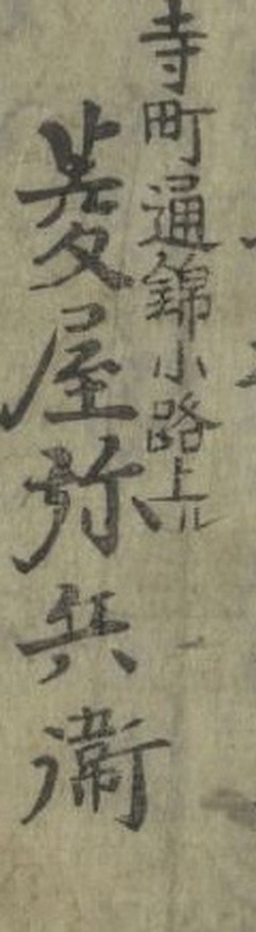菱屋弥兵衛
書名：[琉球人行列記]
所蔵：University of the Ryukyus Library
